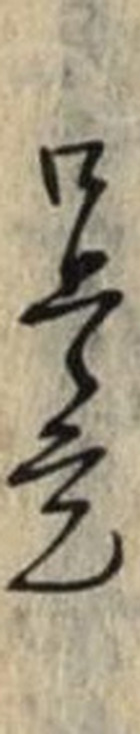口上之覚
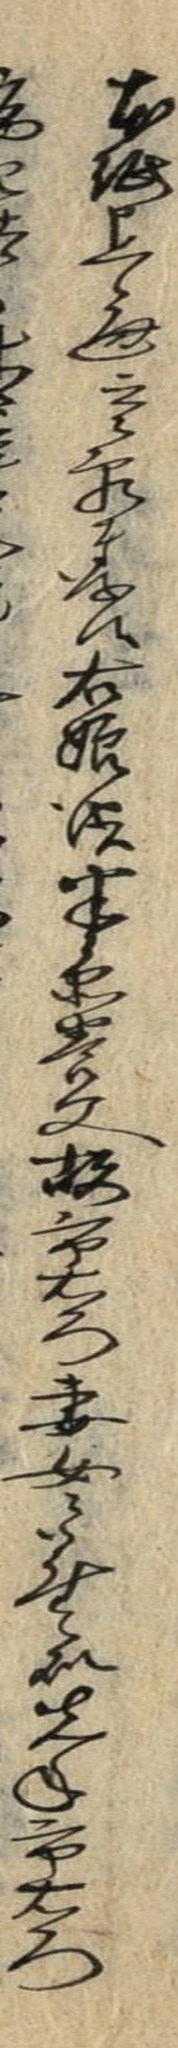本紙申上候通云々願奉存候右娘儀ハ半兵衛養父故市右衛門妻女ニ御座候処先年市右衛門
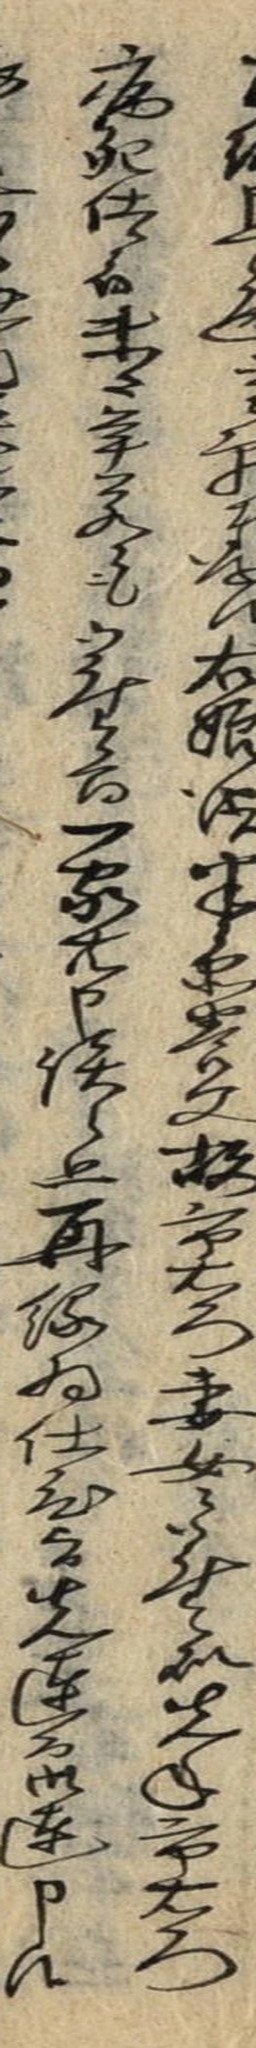病死仕候ニ付未た年若ニも御座候間一家共申談之上再縁為仕度旨先達而御達申候
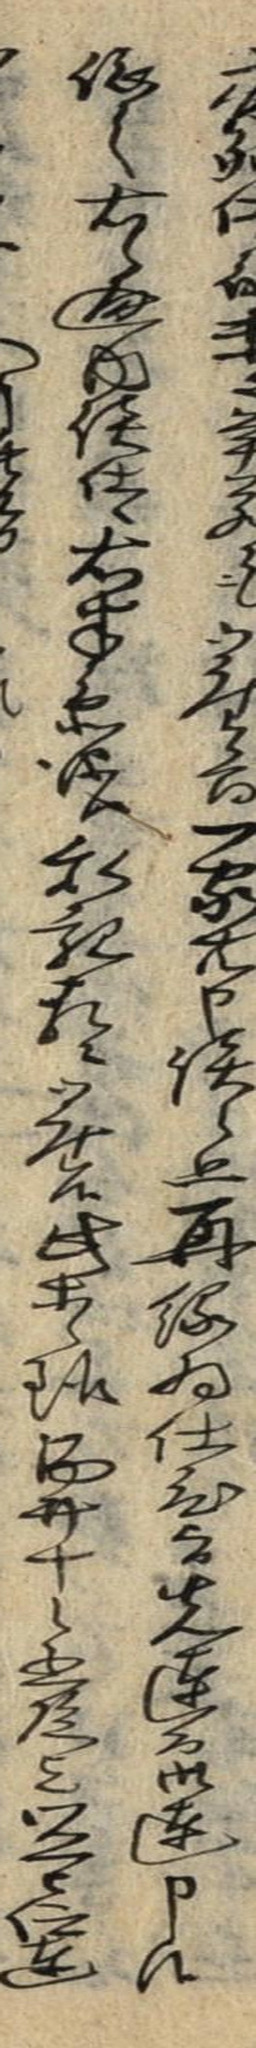依之右之通内談仕候右半兵衛儀ハ私親類ニ御座候此等之趣酒井十之丞殿迄宜被仰達
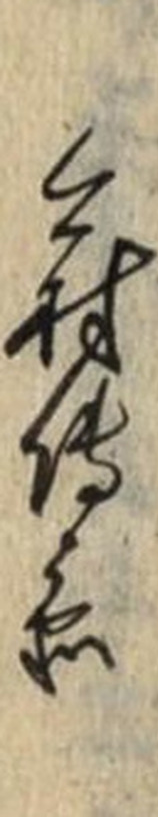今村伝兵衛
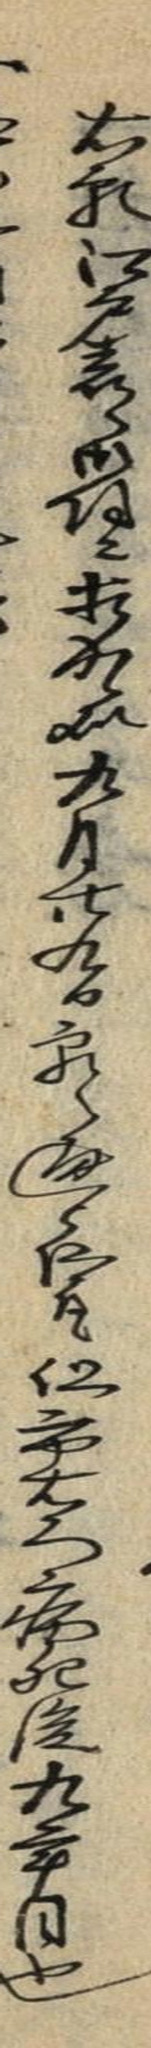右願江戸表へ御伺ニ相成候処九月二十九日願之通被仰付候但市右衛門病死後九年目也
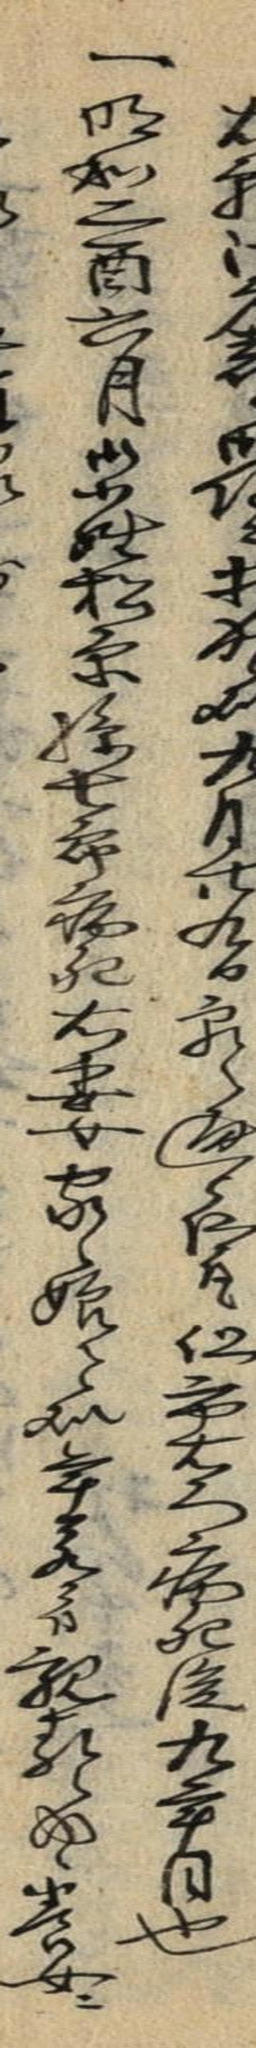一明和二酉六月御小姓松原孫七郎病死右妻女家之娘ニ候処年若ニ付親類之内へ養女ニ
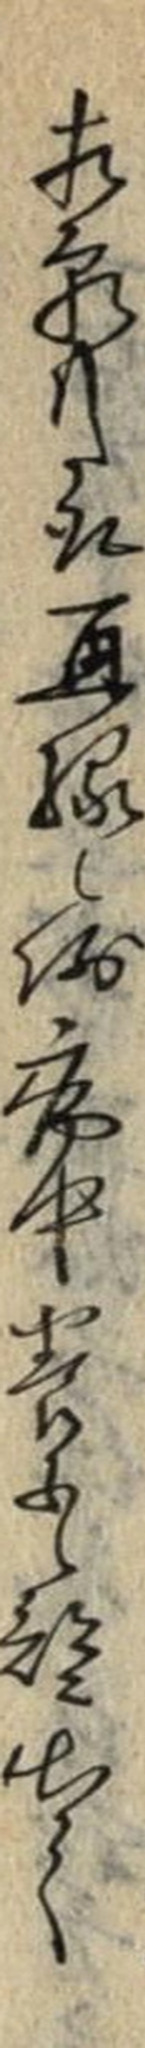相願引取再縁之儀病中養子之部ニ出之
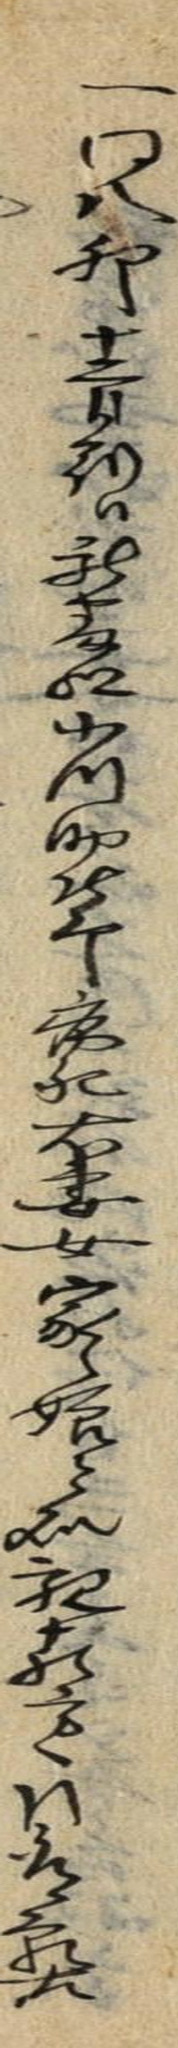一同八卯十二月朔日新番組小川助次郎病死右妻女家之娘ニ候処親類方へ引取願左
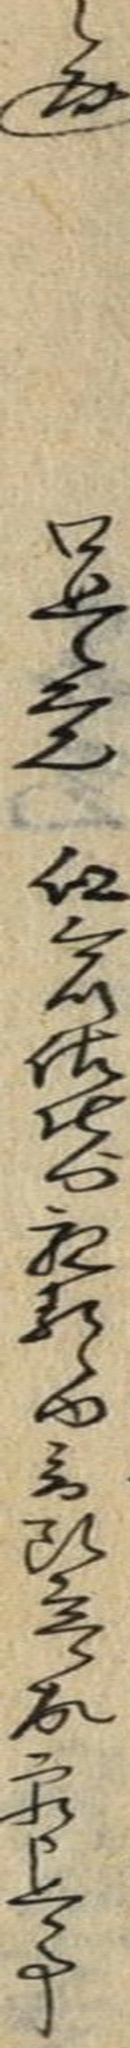口上之覚但今川佐次右衛門親類之内ニ而頭立候故願申上候事
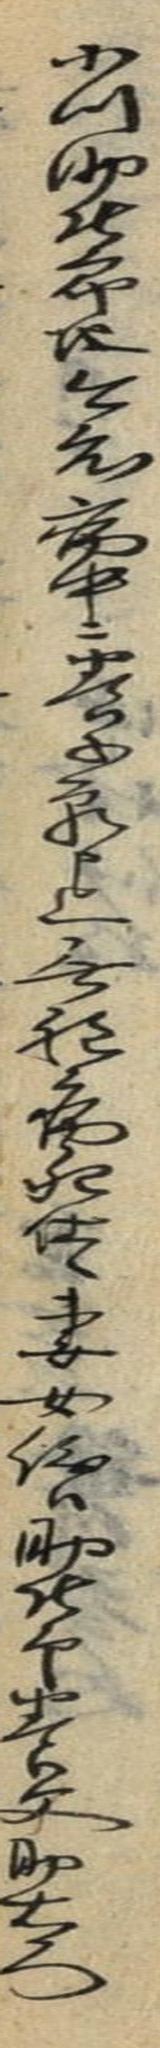小川助次郎儀今度病中ニ養子願申上無程病死仕候妻女儀ハ助次郎養父助右衛門
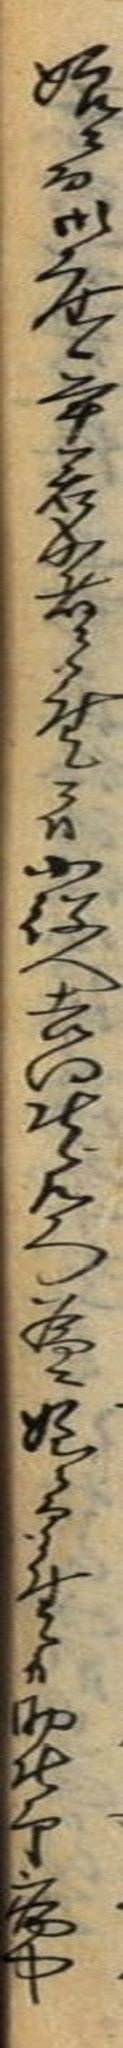娘ニ而御座候年若成者ニ御座候ニ付小役人吉田次郎左衛門為ニ姪ニ而御座候付助次郎病中
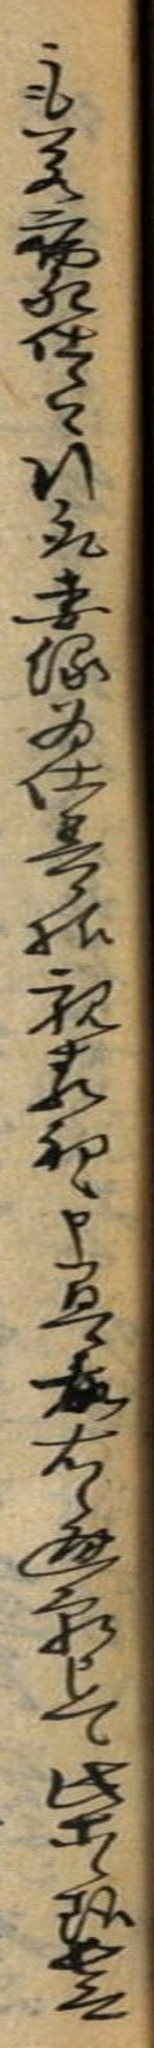ニも若病死仕候ハヽ引取妻縁為仕呉候様親類初ヘ申置候故右之通願申上候此等之趣長谷
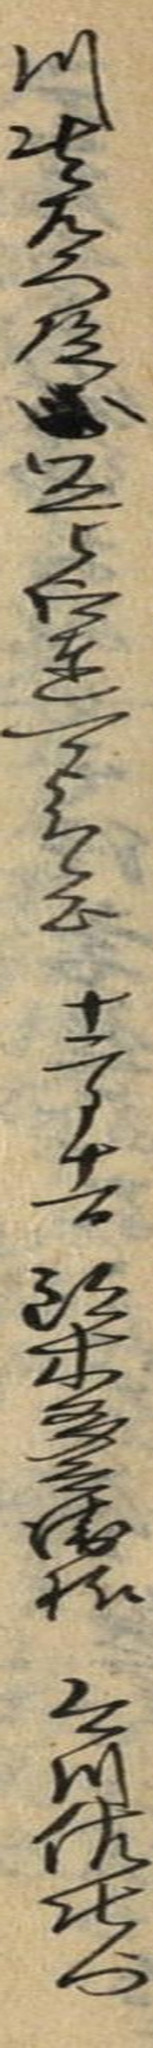川次郎左衛門殿へ宜被仰達可被下候以上十二月十一日鈴木多兵衛様今川佐次右衛門
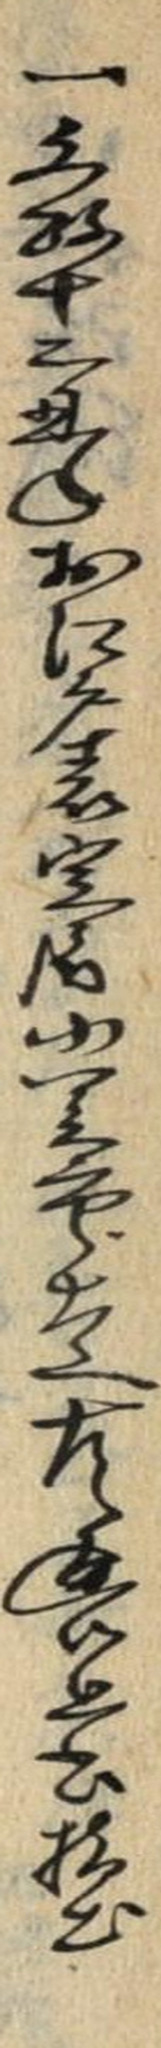一文政十二丑年於江戸表定府小関市郎太夫左之通口上書指出
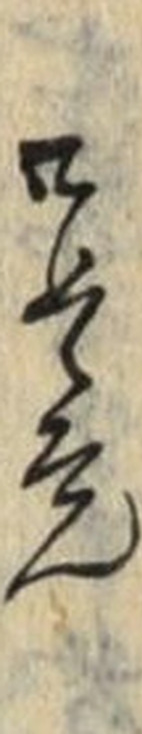口上之覚
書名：養子縁組之部
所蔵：福井県文書館 Fukui Prefectural Archives
